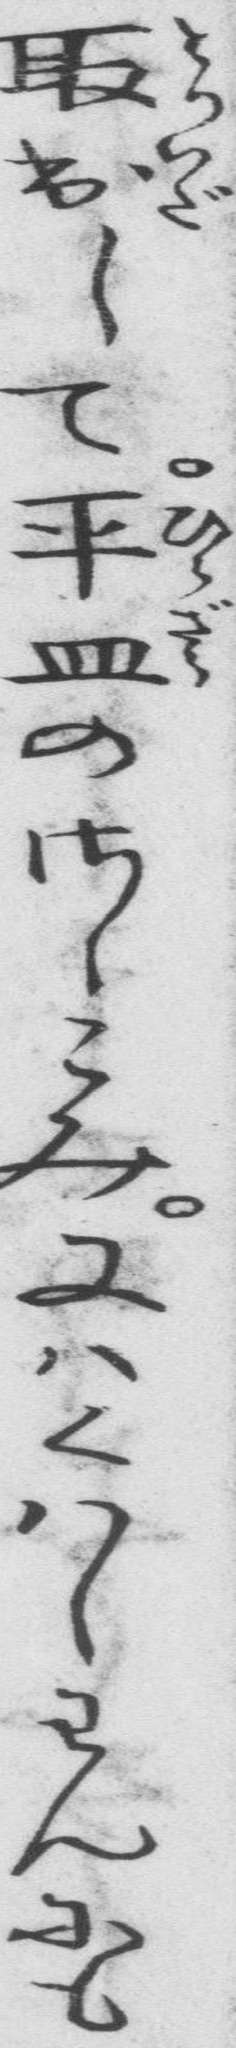取出して。平皿のさしこみ。又はくはしわんにも
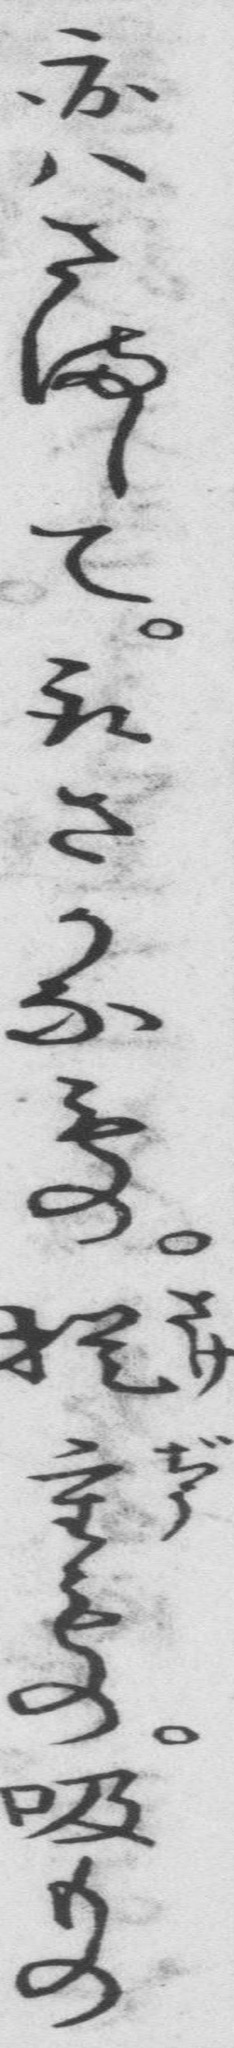亦はさまして。取さかなもの。提重もの。吸もの
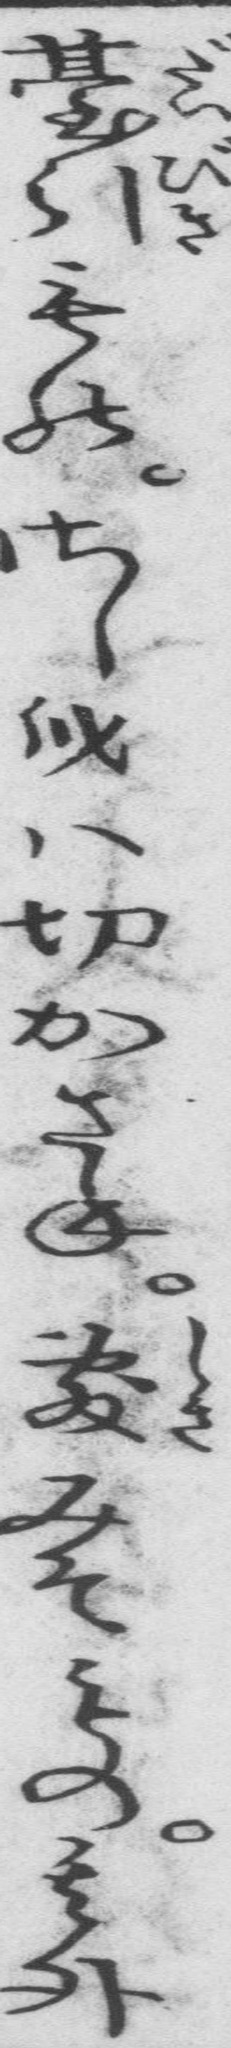台引もの。さし身は切かさね。敷みそもの。其外
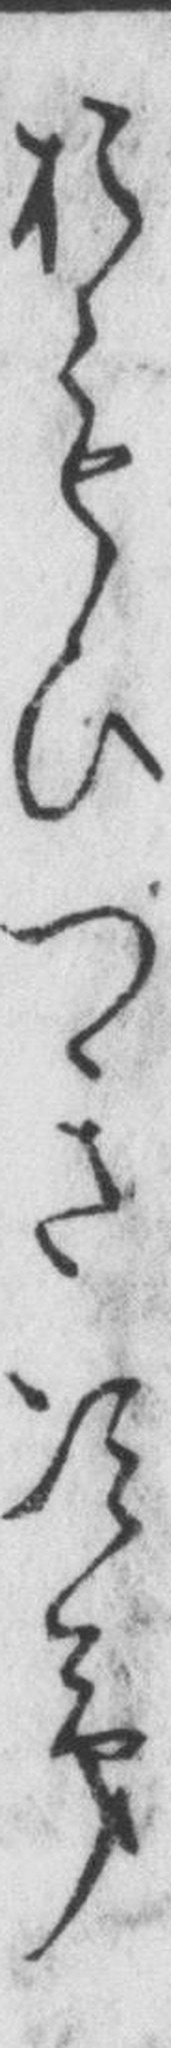おもひつき次第
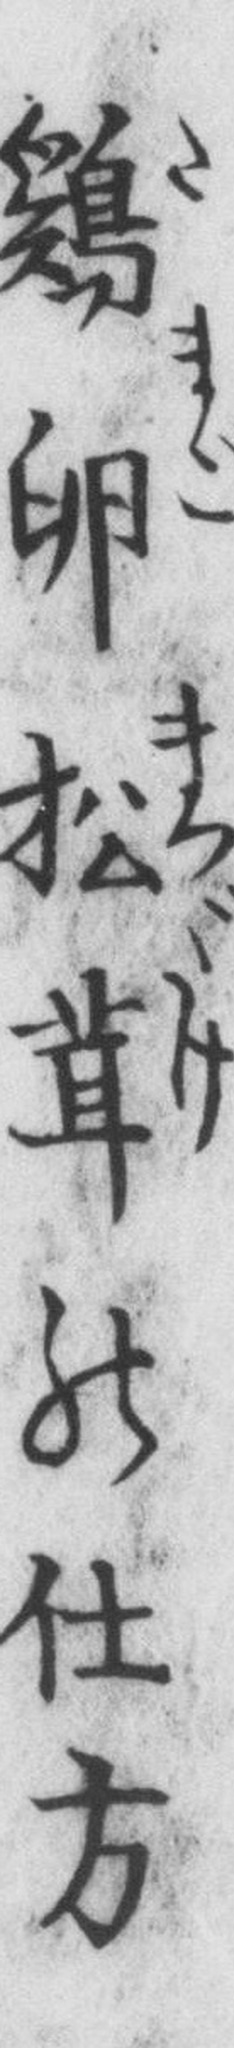鶏卵松茸の仕方
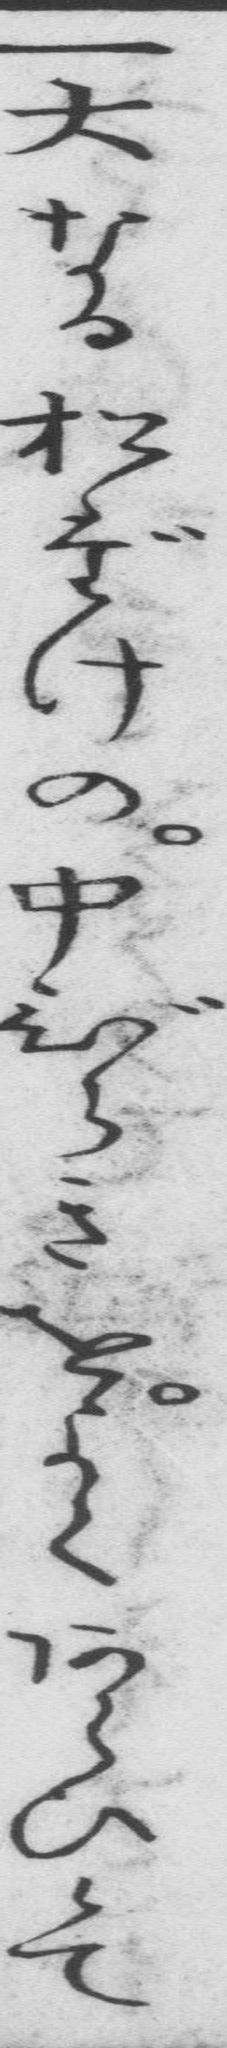一大なる松だけの。中びらきを。よくあらひ候て
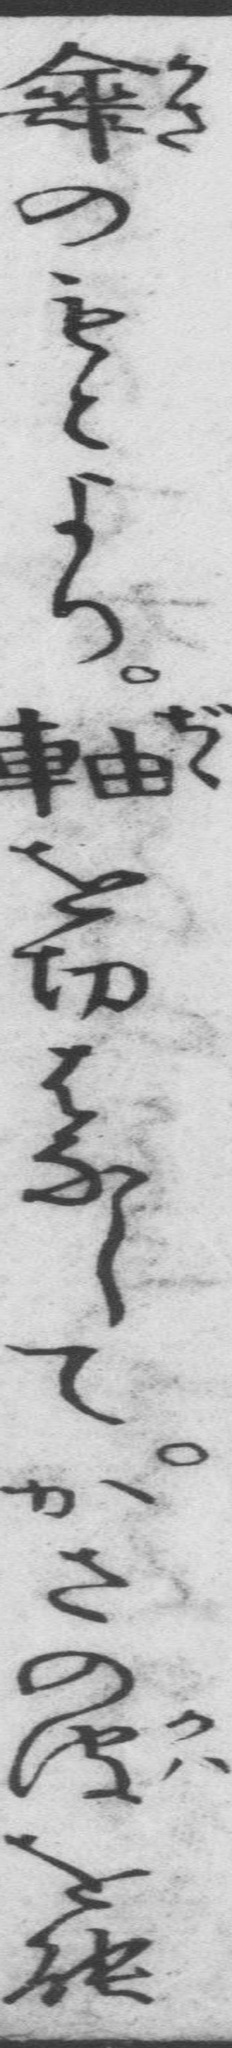傘のもとより。軸を切はなして。かさの皮を能

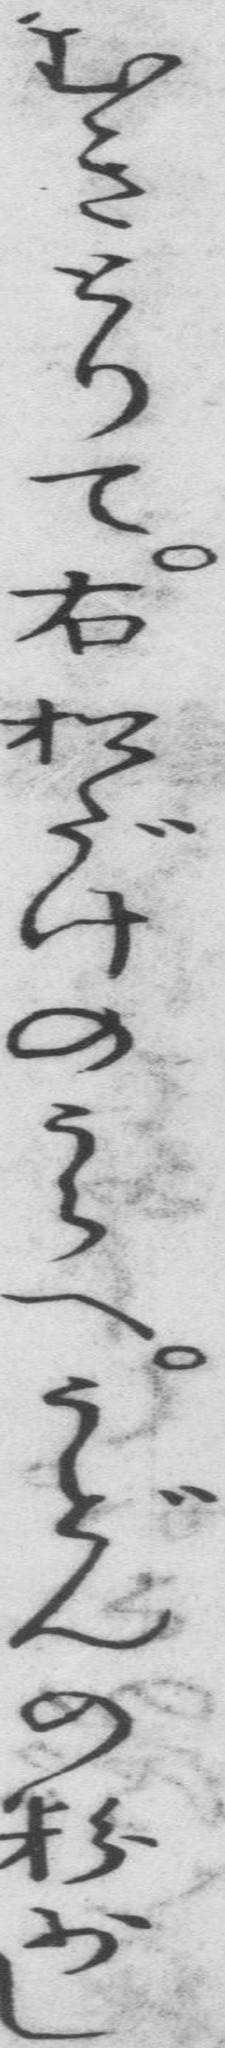むきとりて。右松だけのうらへ。うどんの粉少し
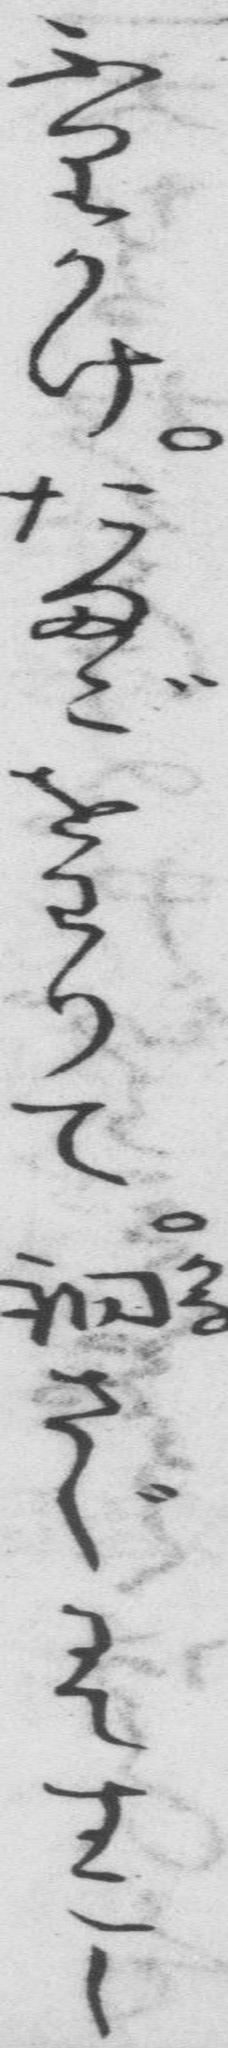ふりかけ。たまごをわりて。銅さじにてすこし
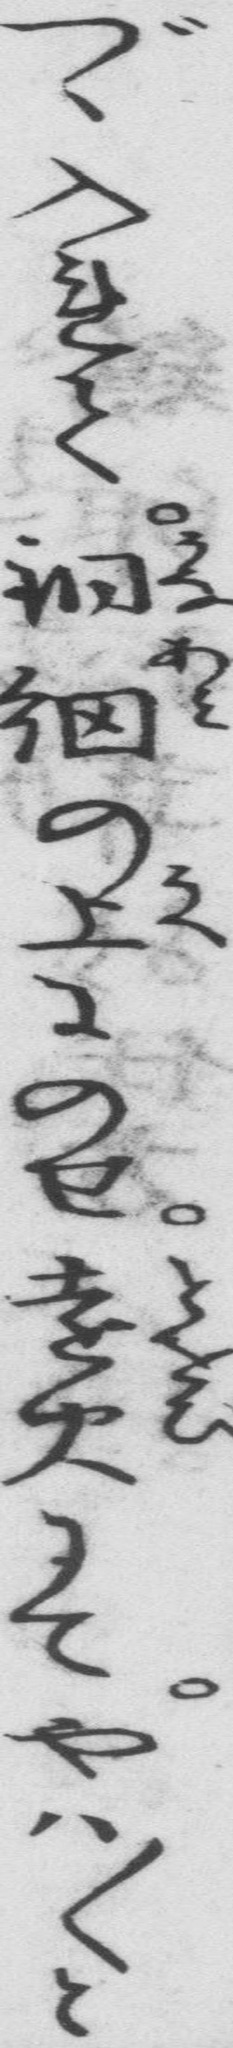づゝ入れて。銅網の上にのせ。遠火にて。やは〳〵と
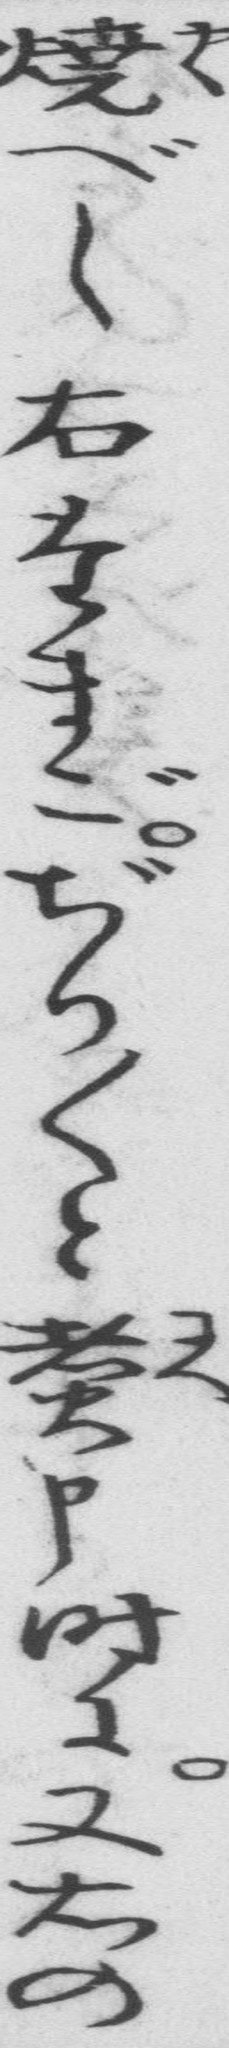焼べし右たまご。ぢり〳〵と煮申時に。又右の
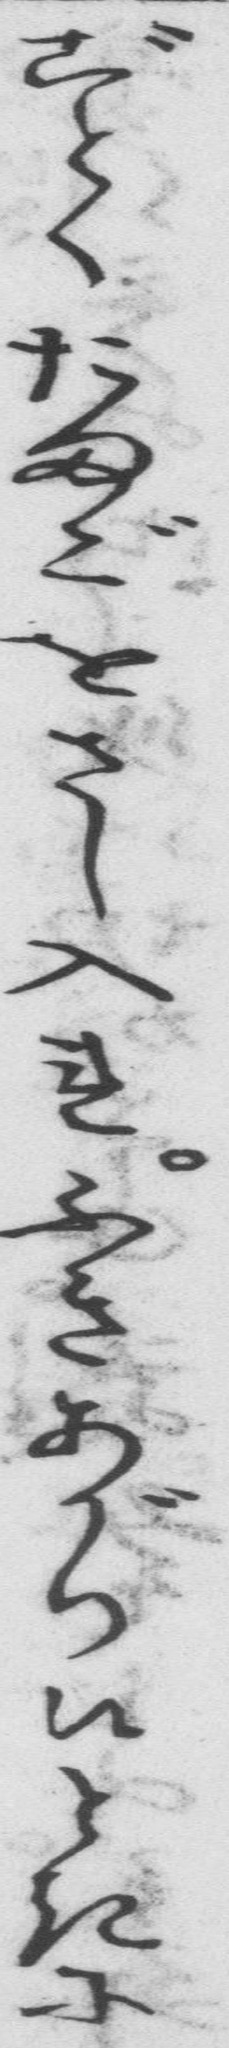ごとくたまご。をさし入れ。ふきあがり候ときに
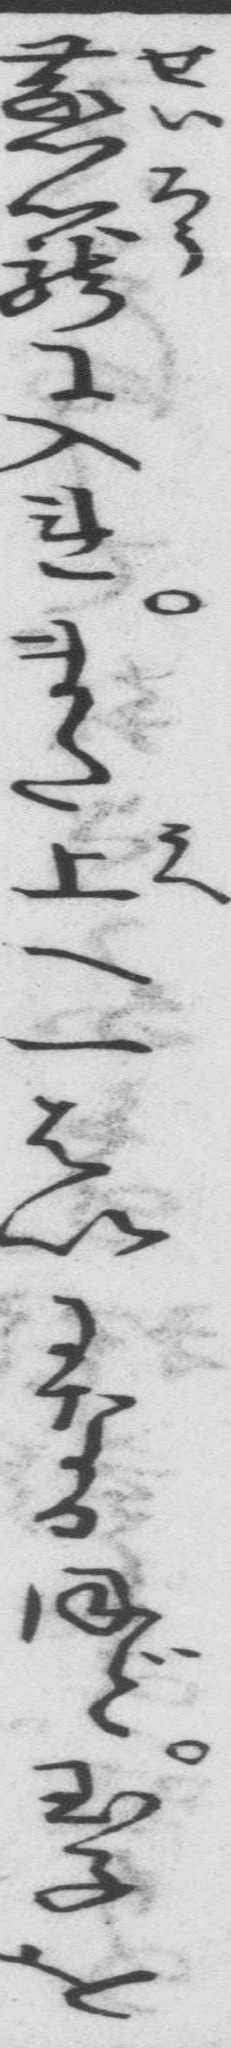蒸籠に入れ。また上へ一はいになるほど。玉子を
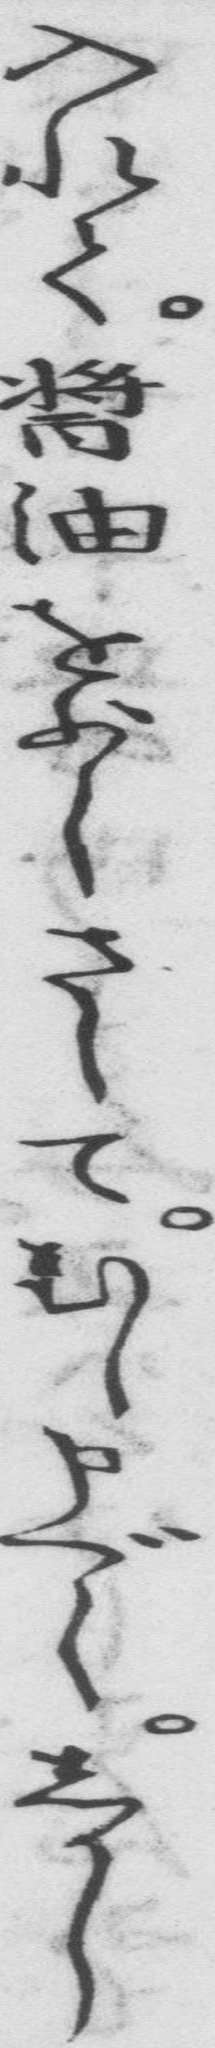入れて。醤油を少しさして。むし申べし。しかし
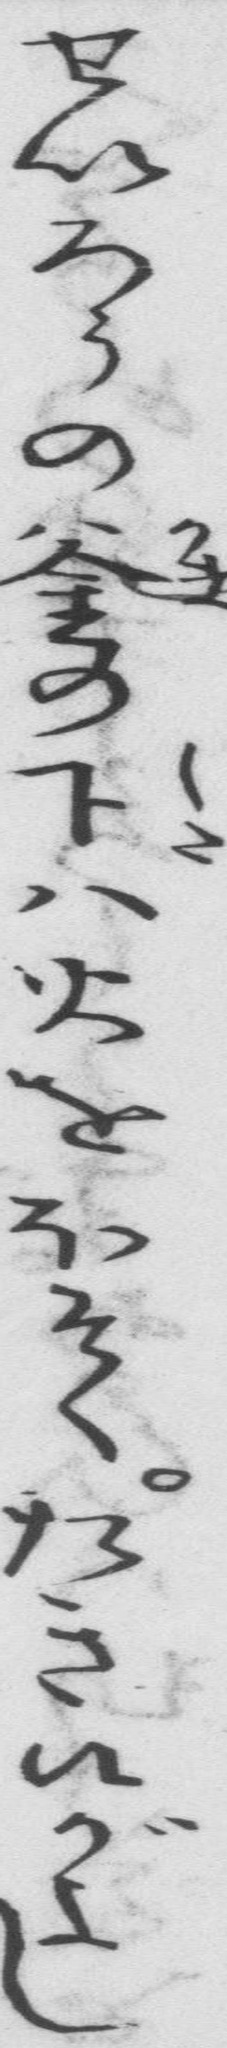せいろうの釜の下は火をほそく。たき候がよし
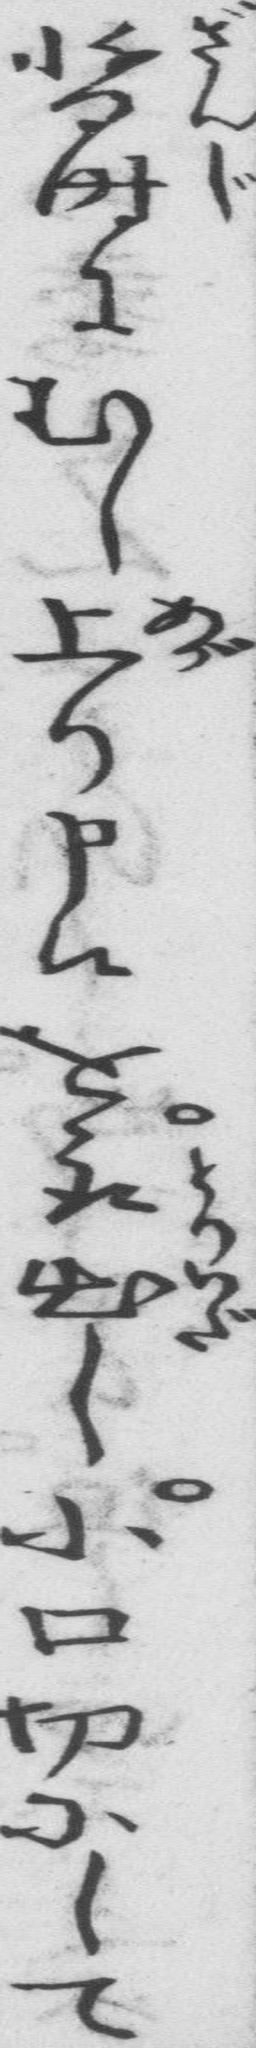暫時にむし上り申候を。取出し。小口切にして
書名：萬寳料理秘密箱
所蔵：大阪府立大学学術情報センター 国文学研究資料館
